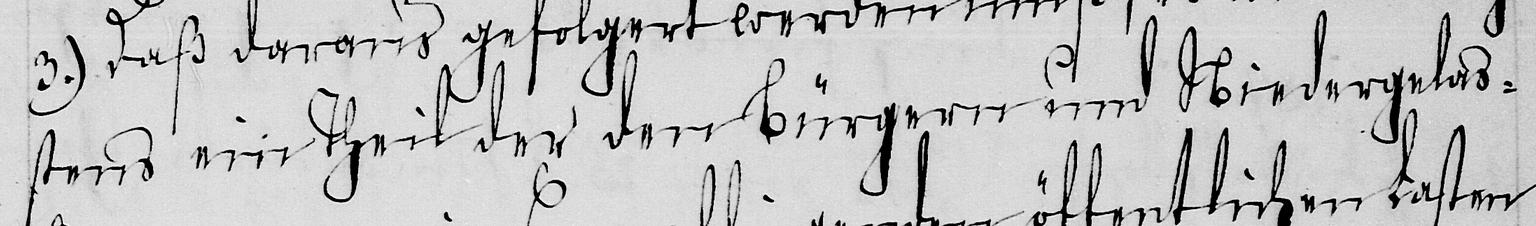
stens ein Theil der den Bürgern und Niedergelaß¬
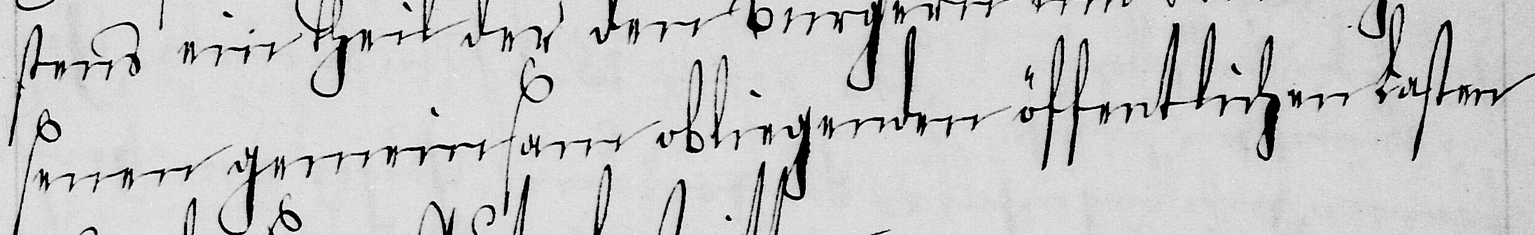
enen gemeinsam obliegenden öffentlichen Lasten
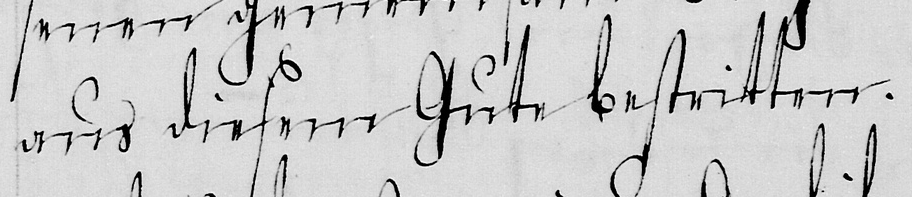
aus diesem Gute bestritten.
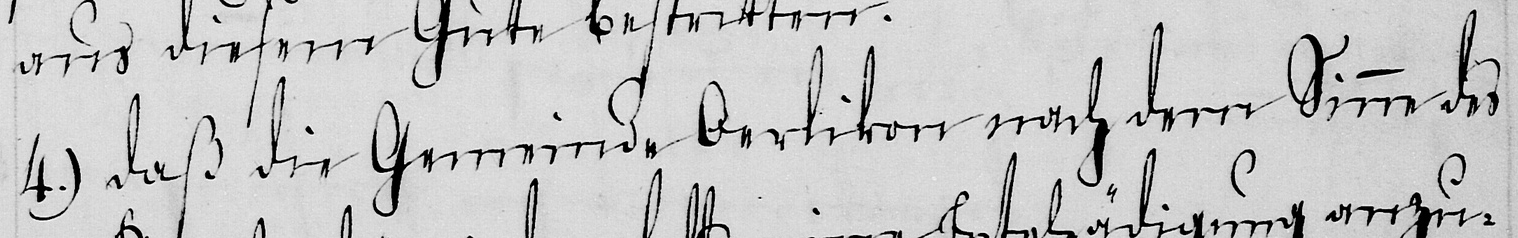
4.) daß die Gemeinde Oerlikon nach dem Sinne des
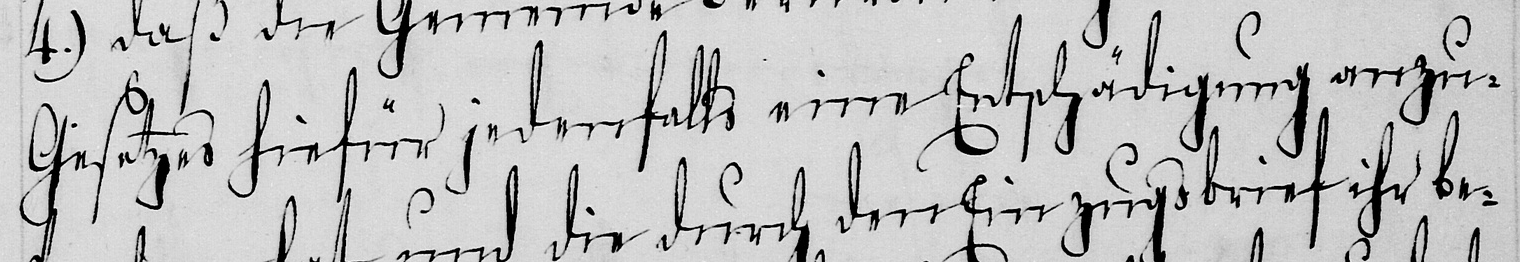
Gesetzes hiefür jedenfalls eine Entschädigung anzu¬
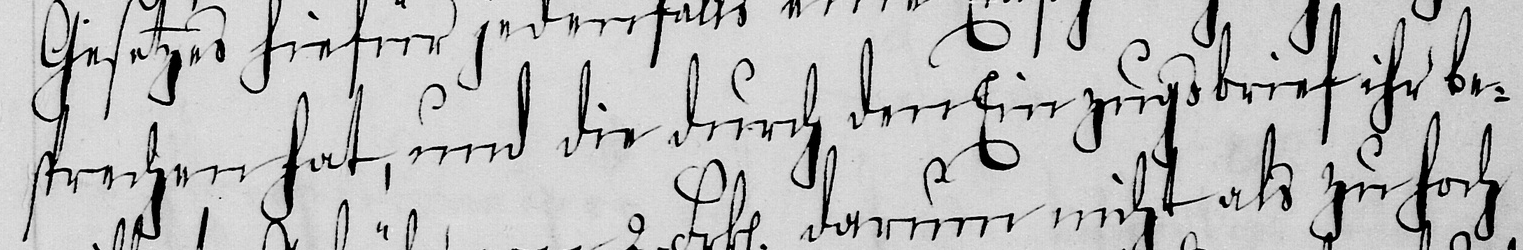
sprechen hat, und die durch den Einzugsbrief ihr be¬
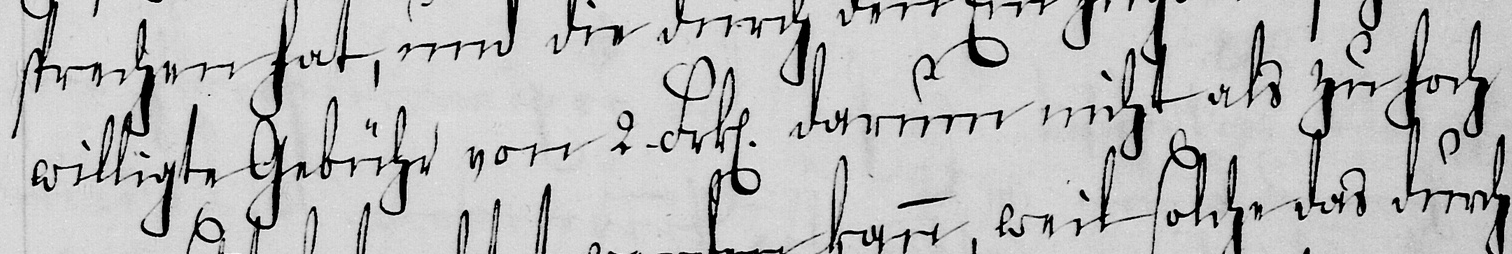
willigte Gebühr von 2. Frk[en]. darum nicht als zu hoch
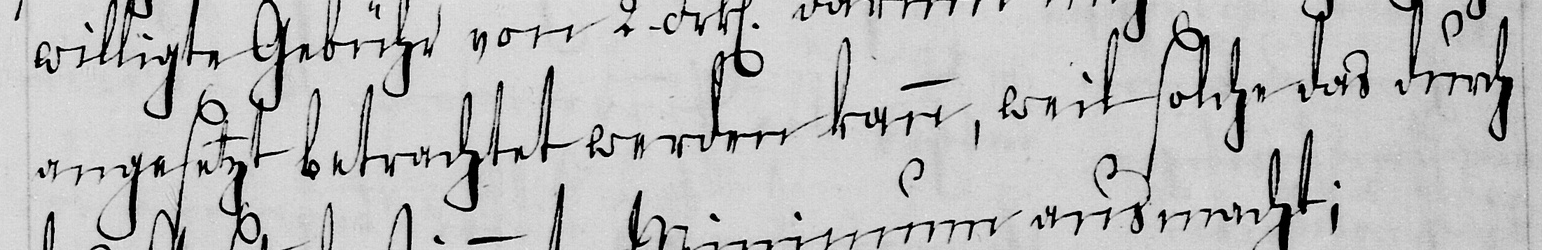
angesetzt betrachtet werden kann, weil solche das durch
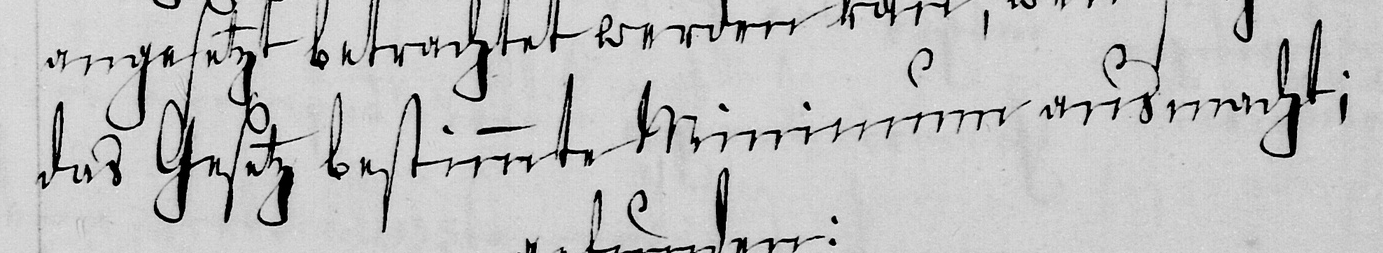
das Gesetz bestimmte Minimum ausmacht;
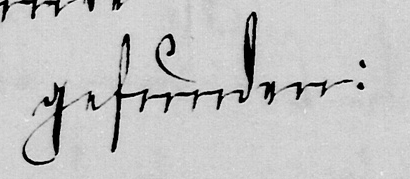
gefunden:
